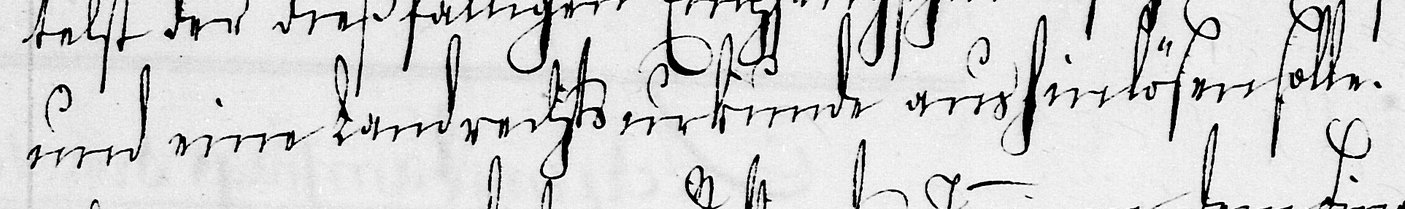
und eine Landrechtsurkunde aushinlösen solle.
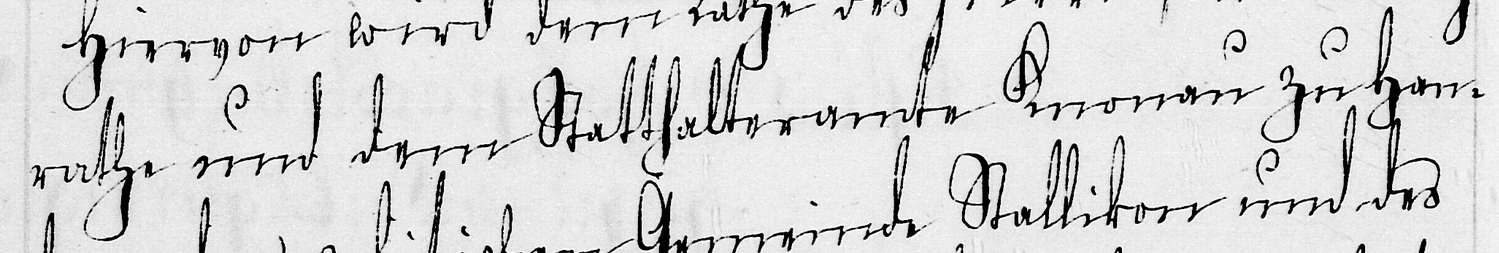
rathe und dem Statthalteramte Knonau zu Han¬
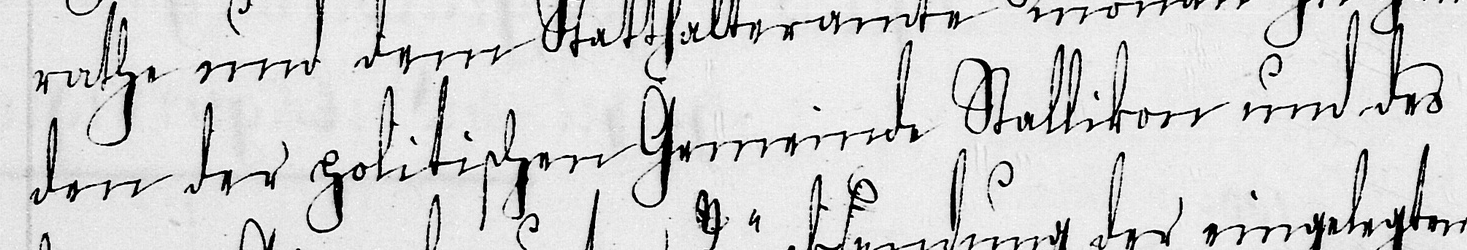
den der politischen Gemeinde Stallikon und des
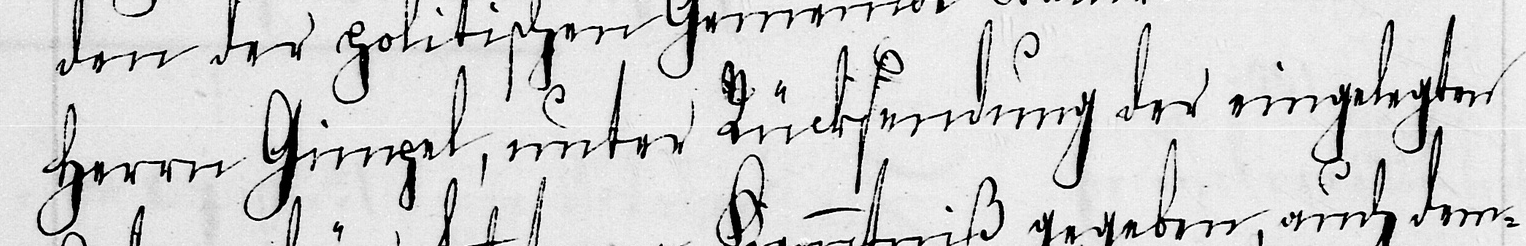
Herrn Gimpel, unter Rücksendung der eingelegten
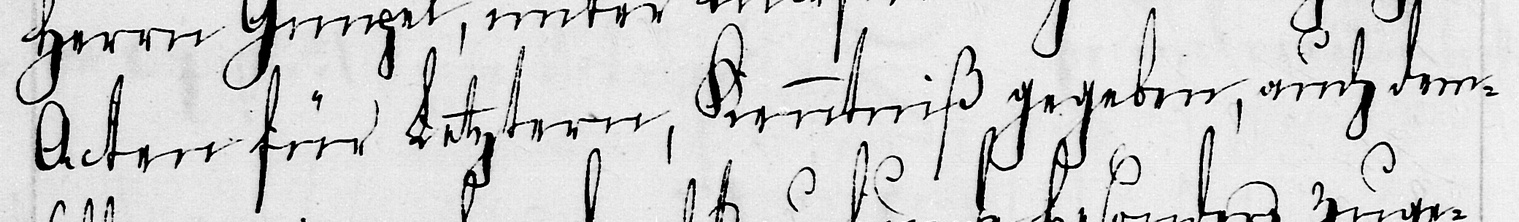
Acten für Letztern, Kenntniß gegeben, auch dem¬
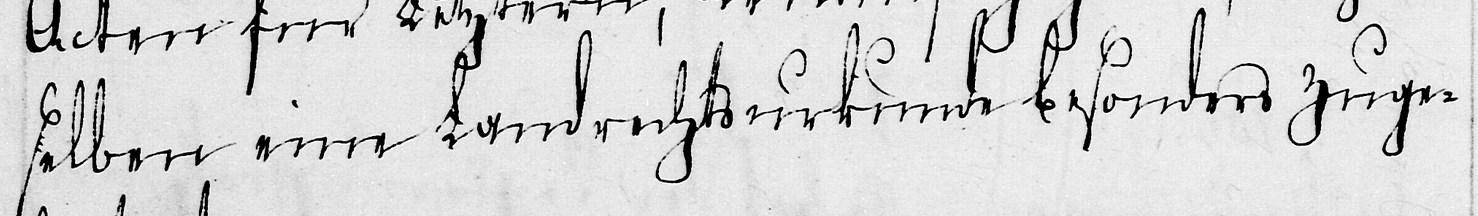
selben eine Landrechtsurkunde besonders zuge¬
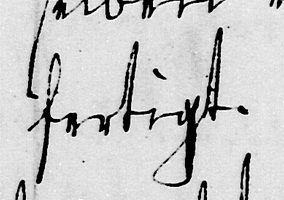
fertigt.
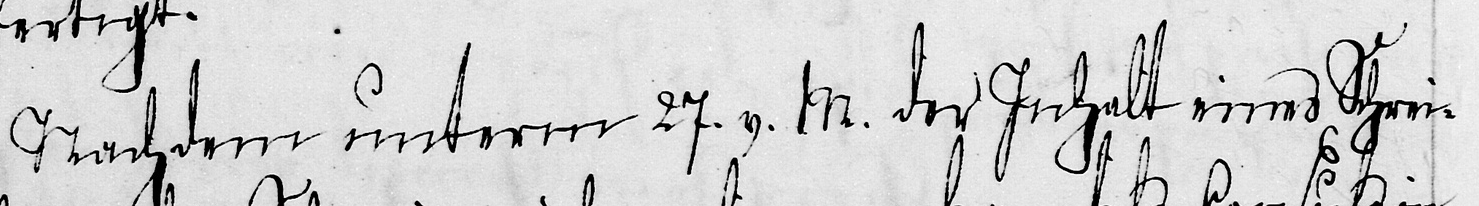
Nachdem unterm 27. v. M. der Inhalt eines Schrei¬
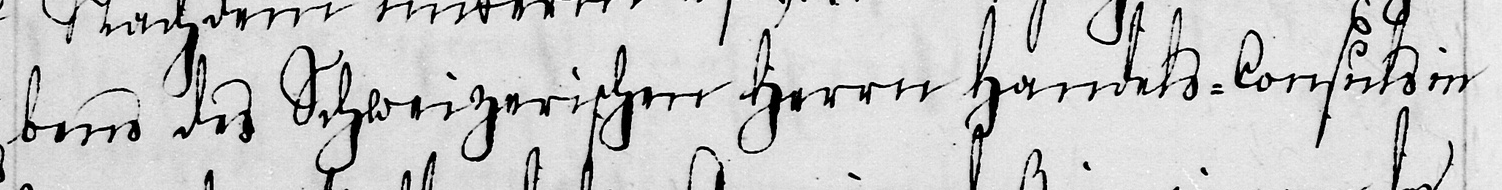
bens des Schweizerischen Herrn Handels-Consuls in
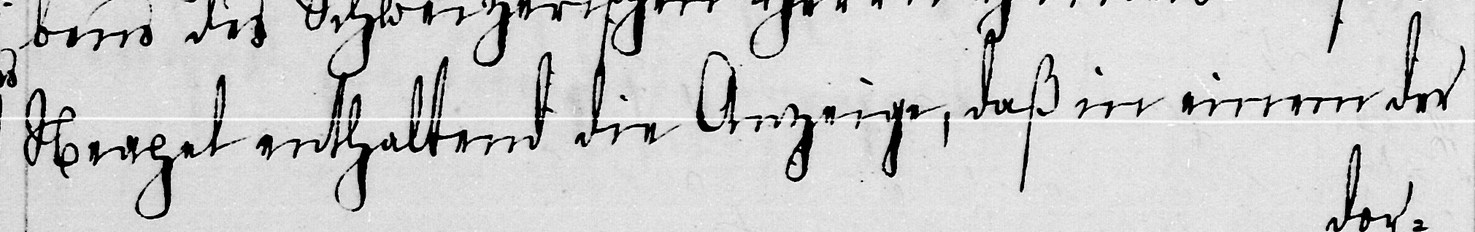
Neapel enthaltend die Anzeige, daß in einem der
